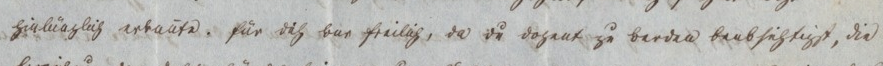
hinlänglich erkannte. Für Dich war freilich, da Du Dozent zu werden beabsichtigst, die
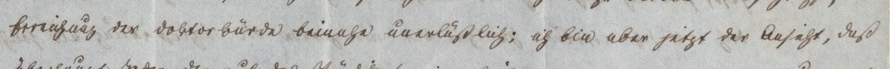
Erreichung der Doktorwürde beinahe unerläßlich; ich bin aber jetzt der Ansicht, daß
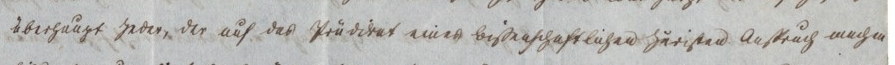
überhaupt Jeder, der auf das Prädikat eines wissenschaftlichen Juristen Anspruch machen
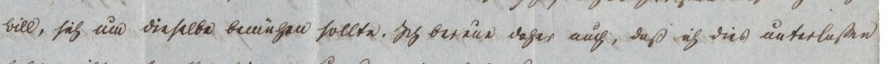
will, sich um dieselbe bemühen sollte. Ich bereue daher auch, daß ich dies unterlassen
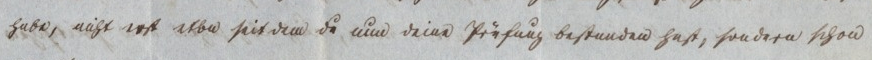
habe, nicht erst etwa seit dem Du nun Deine Prüfung bestanden hast, sondern schon
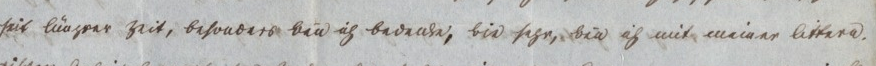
seit längrer Zeit, besonders wenn ich bedenke, wie sehr, wenn ich mit meiner littera-
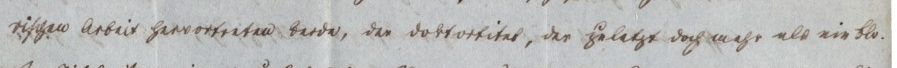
rischen Arbeit hervortreten werde, der Doktortitel, der zuletzt doch mehr als ein blo-
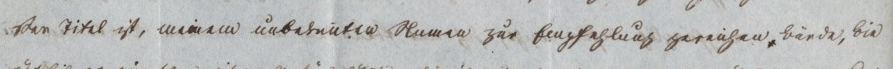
ßer Titel ist, meinem unbekannten Namen zur Empfehlung gereichen würde, wie
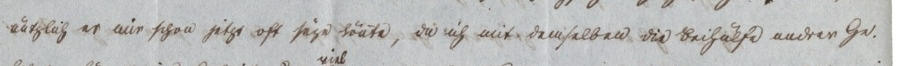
nützlich er mir schon jetzt oft seyn könnte, da ich mit demselben die Beihülfe andrer Ge-
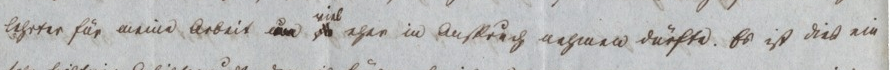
lehrter für meine Arbeit um soviel eher in Anspruch nehmen dürfte. Es ist dies ein
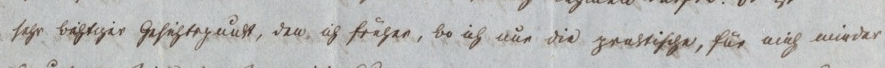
sehr wichtiger Gesichtspunkt, den ich früher, wo ich nur die praktische, für mich minder
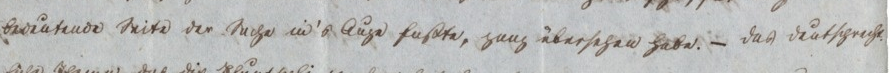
bedeutende Seite der Sache in's Auge faßte, ganz übersehen habe. – Das deutschrecht-
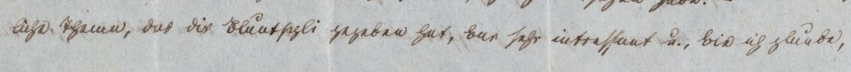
liche Thema, das Dir Bluntschli gegeben hat, war sehr intressant u., wie ich glaube,
